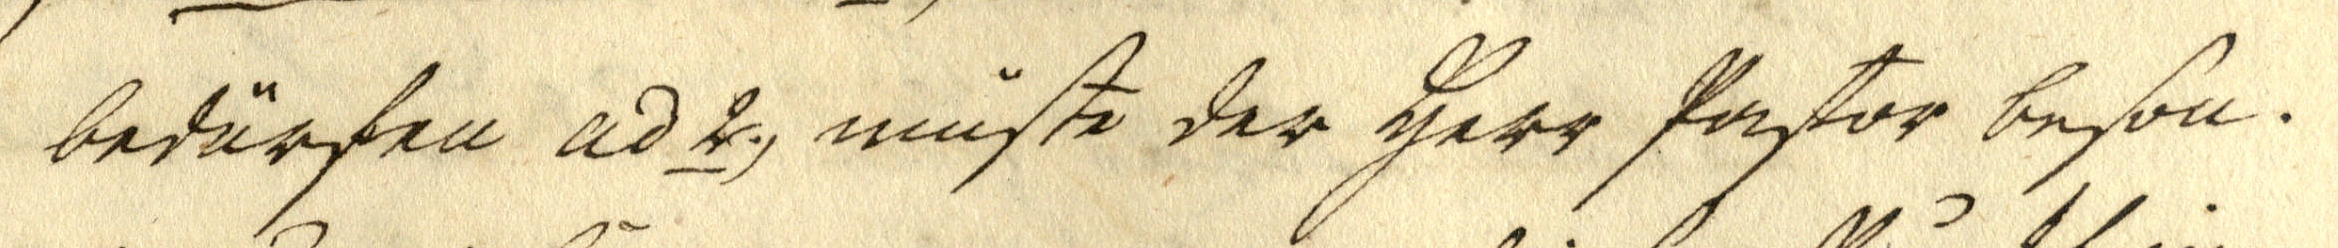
bedürfen ad 2., müßte der Herr Pastor beson-
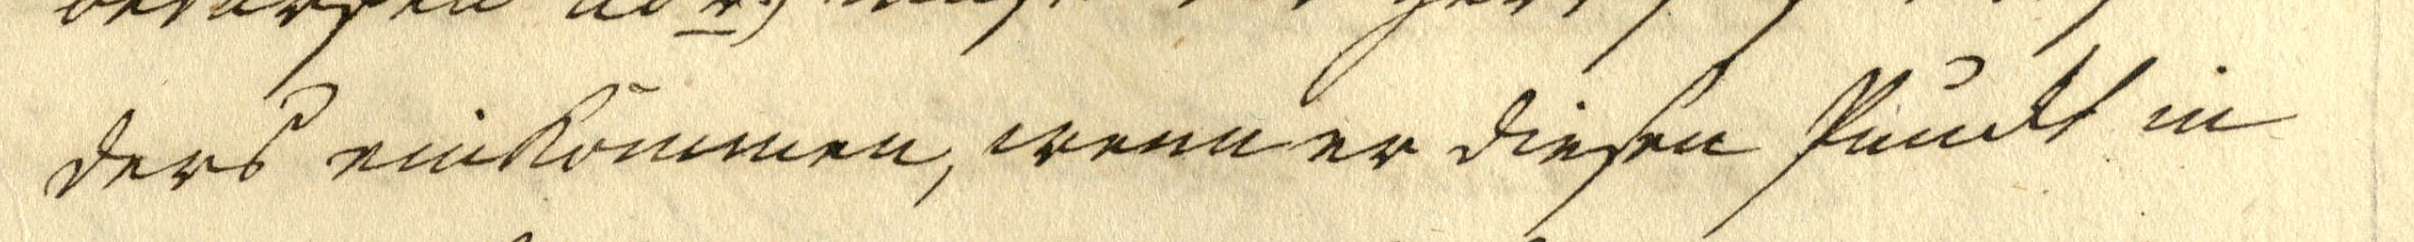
ders einkommen, wenn er diesen Punkt in
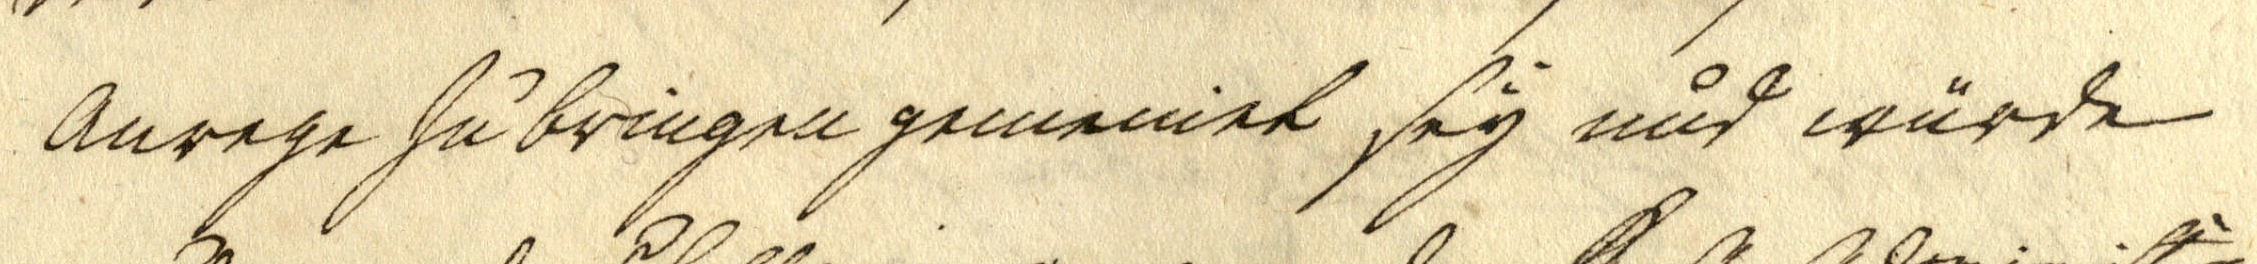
Anrege zu bringen gemeinet sey und würde
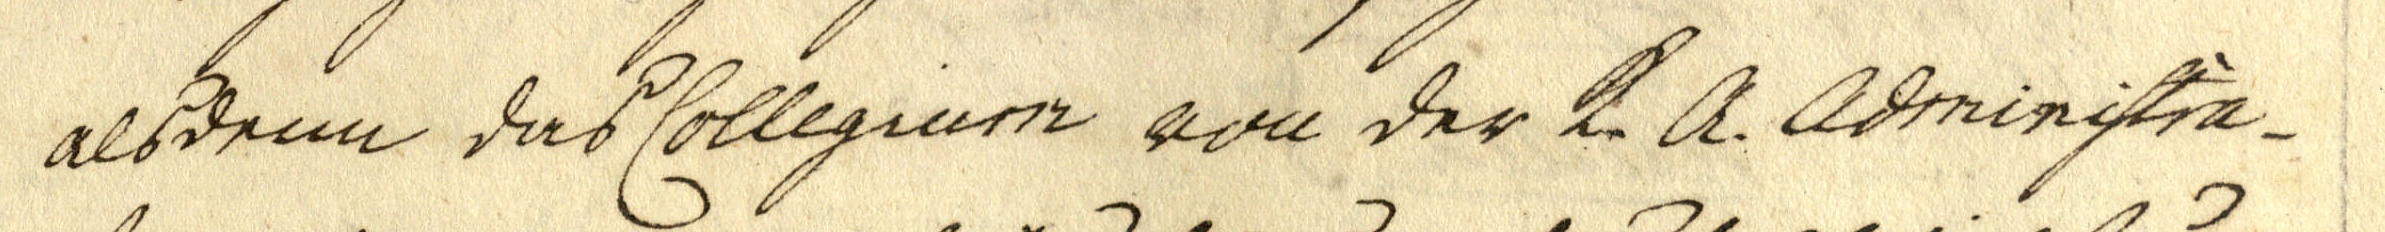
alsdenn das Collegium von der K. A. Administra-
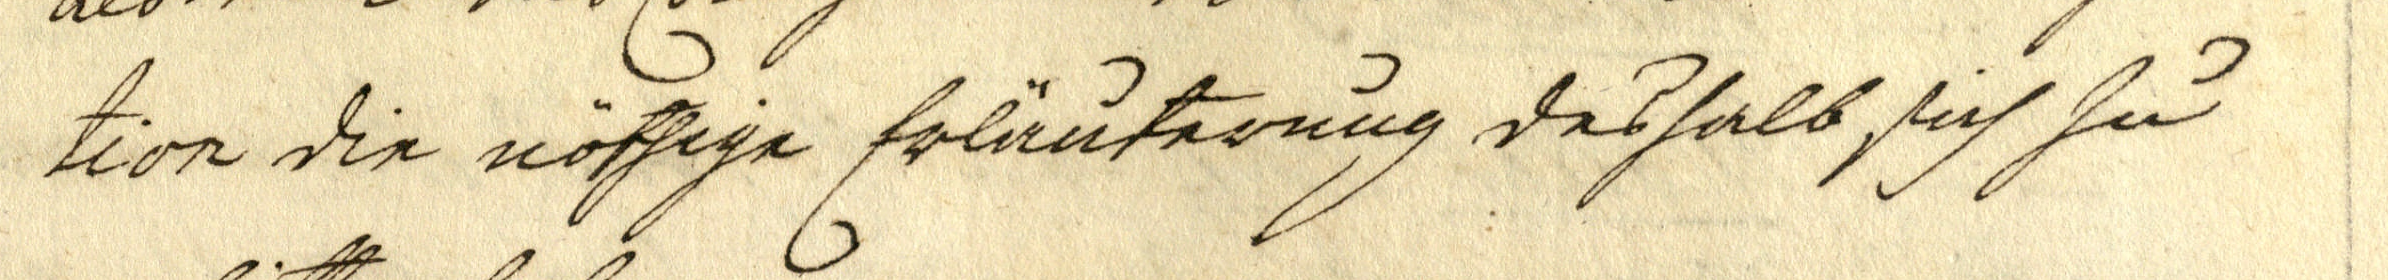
tion die nöthige Erläuterung deshalb sich zu
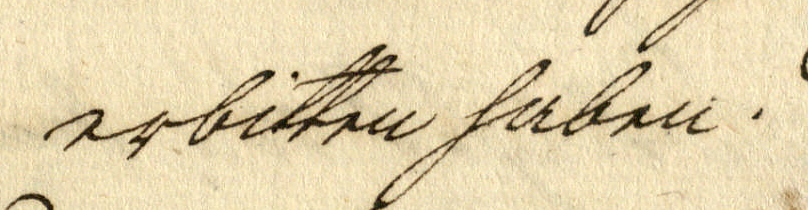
erbitten haben.
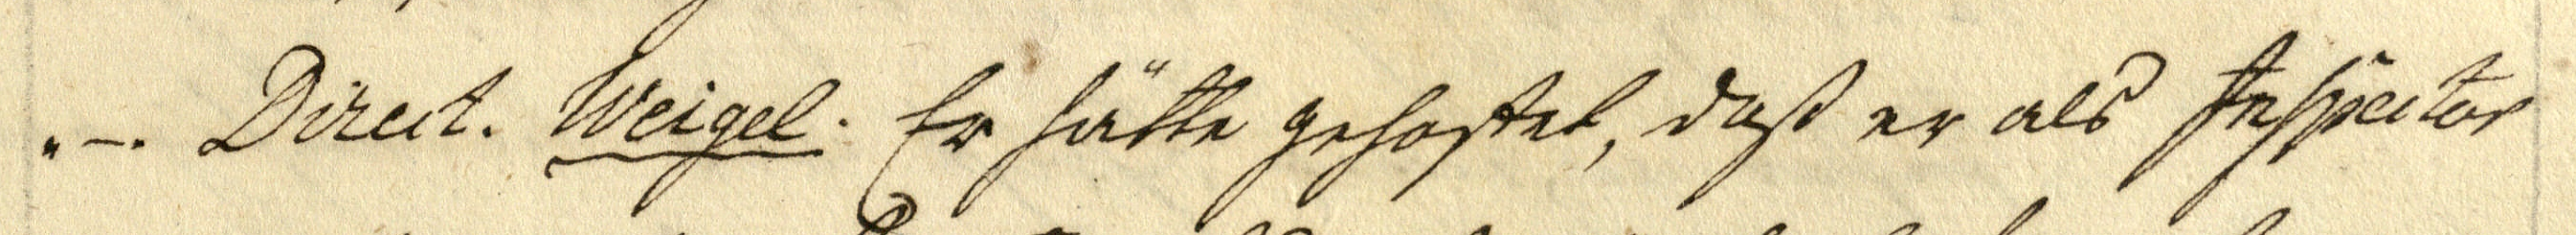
" - " Direct. Weigel. Er hätte gehoffet, daß er als Inspector
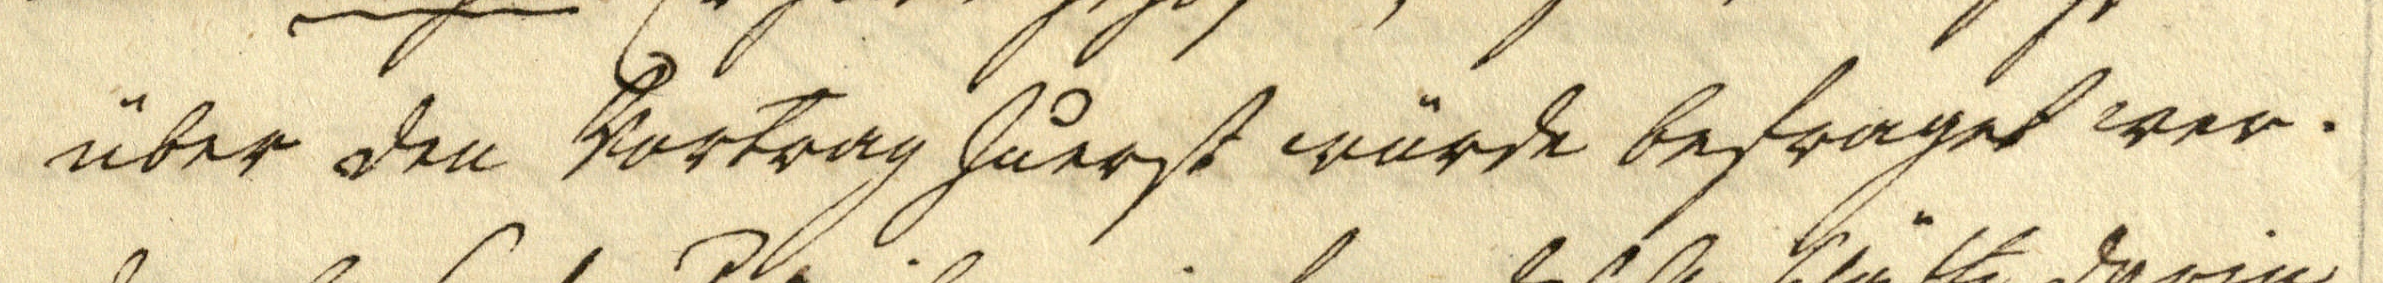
über den Vortrag zuerst würde befraget wer-
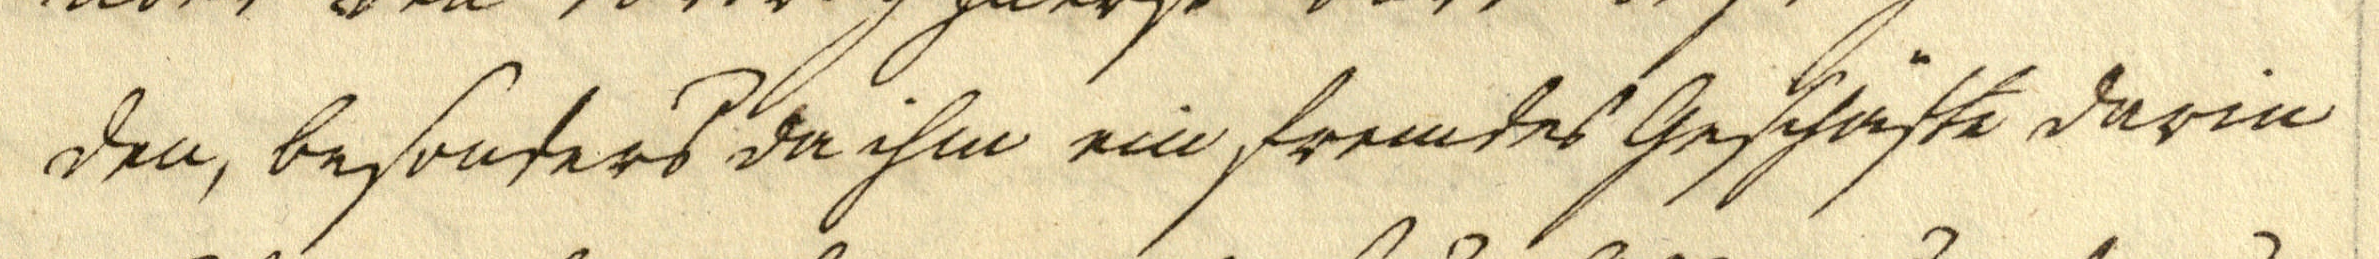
den, besonders da ihm ein fremdes Geschäfte darin
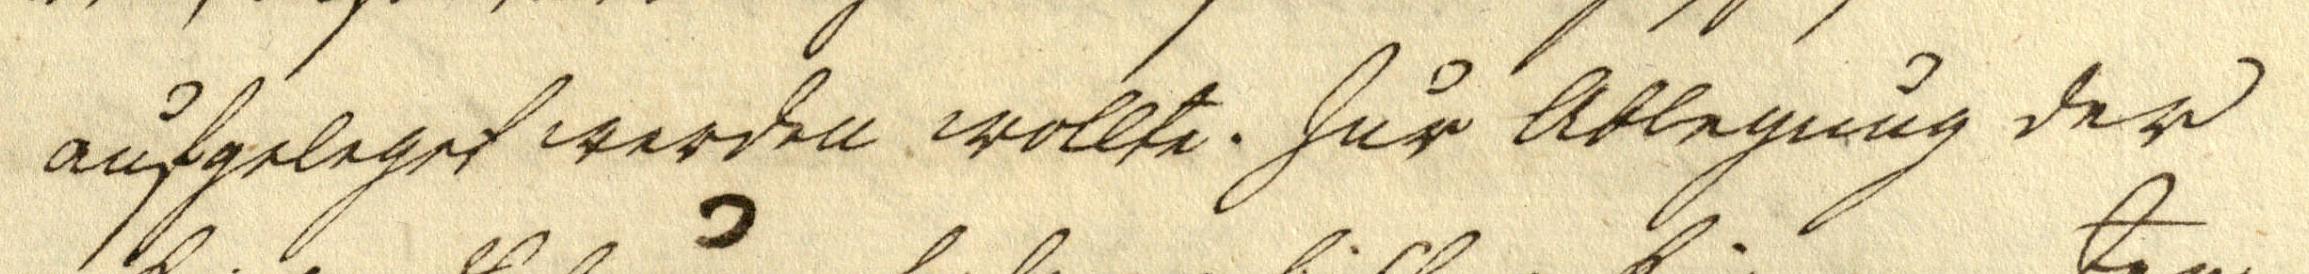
aufgeleget werden wollte. Zur Ablegung der
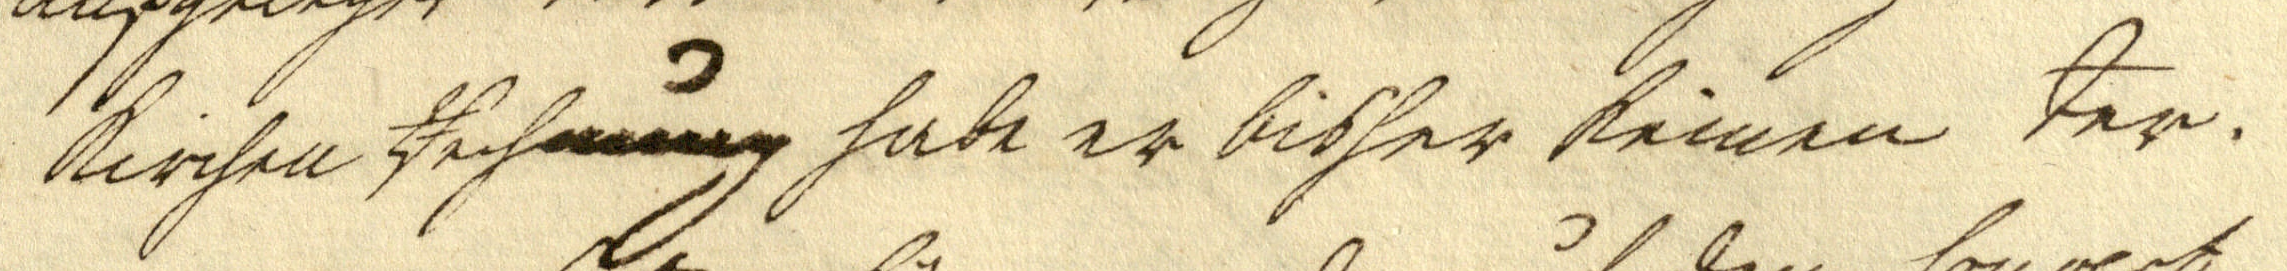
Kirchen Rechnung habe er bisher keinen Ter-
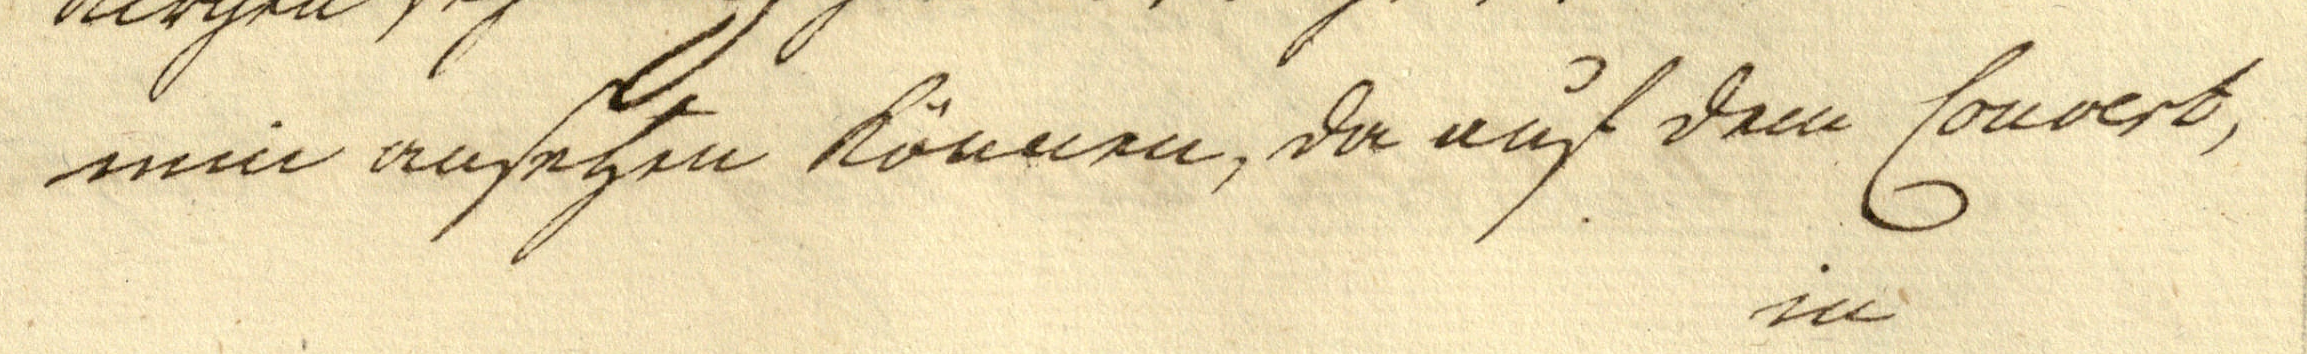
min ansetzen können, da auf dem Couvert,
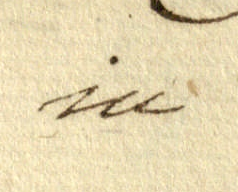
in
